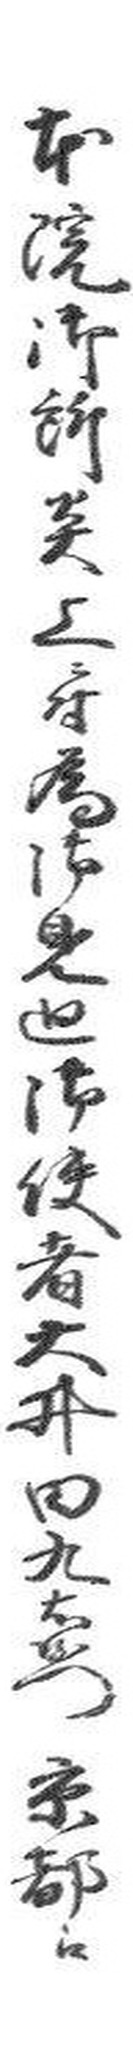本院御所炎上ニ付為御見廻御使者大井田九右衛門京都江
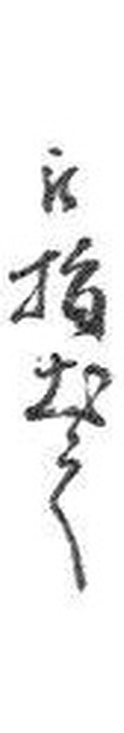被指出之
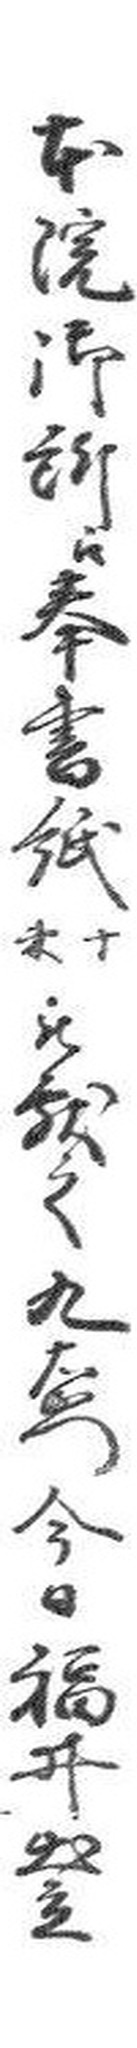本院御所江奉書紙十束被献之久右衛門今日福井出立
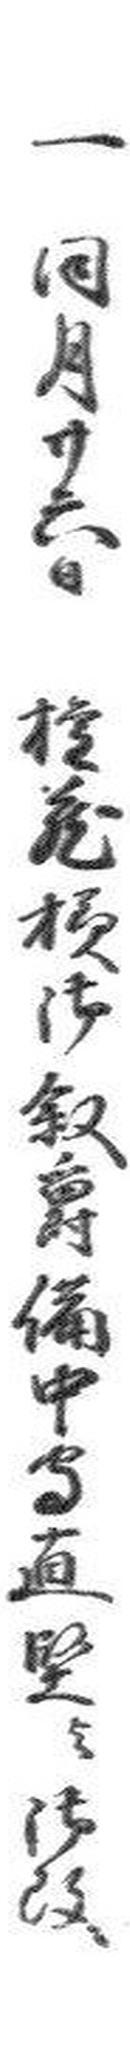一同月廿六日権蔵様御叙爵備中守直堅与御改
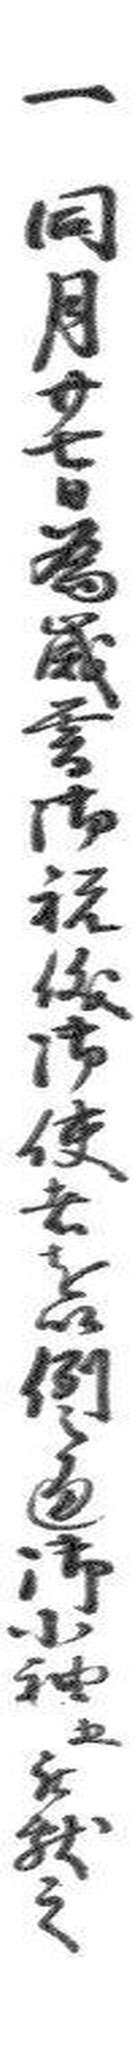一同月廿七日為歳暮御祝儀御使者を以例之通御小袖五被献之
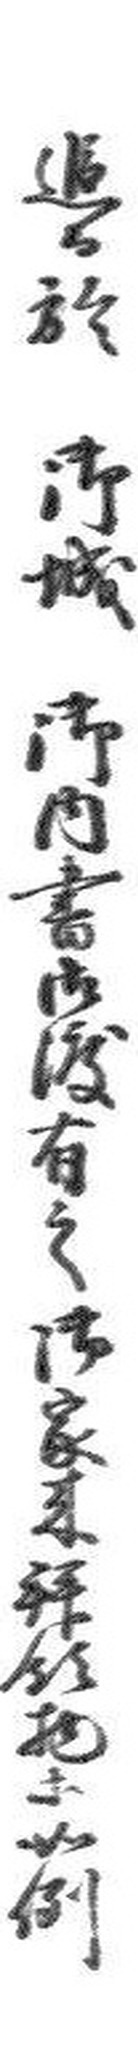追而於御城御内書御渡有之御家来拝領物等如例
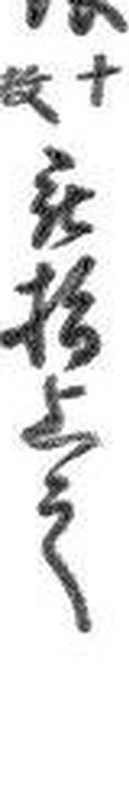被指出之
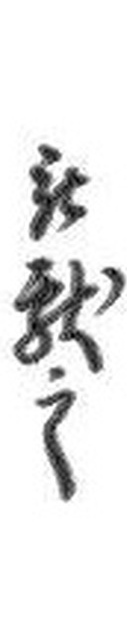被献之
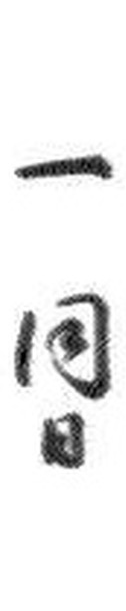一同日

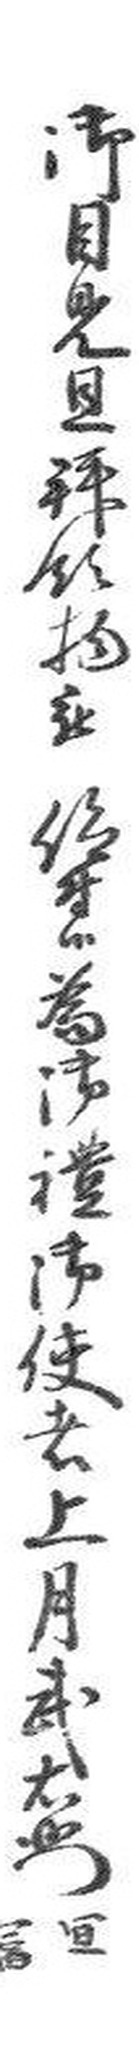御目見且拝領物被仰付候為御礼御使者上月武右衛門宜富
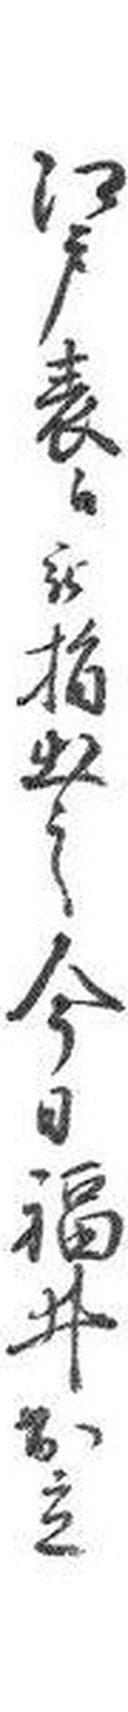江戸表江被指出之今日福井出立
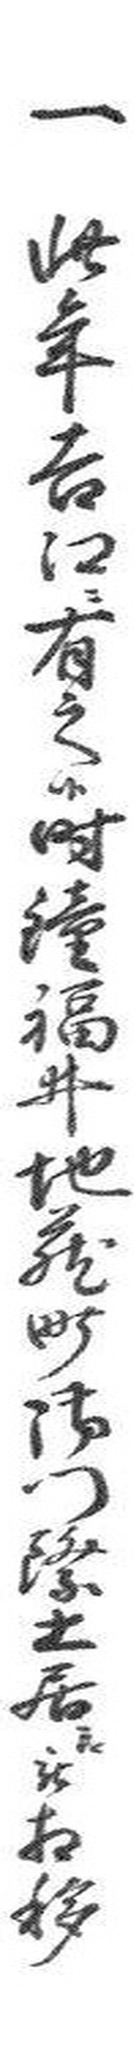一此年吉江ニ有之候時鐘福井地蔵町御門際土居江被相移
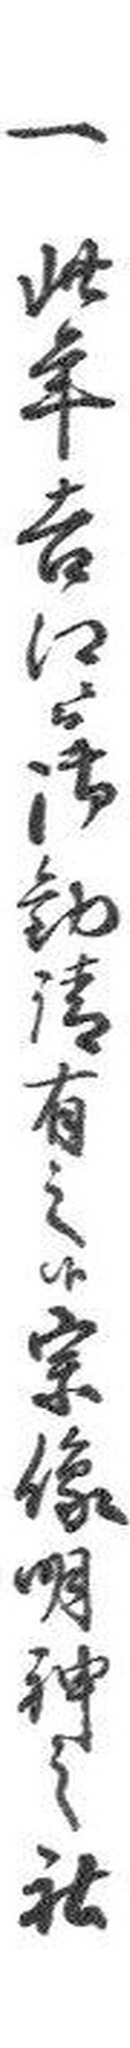一此年吉江ニ而御勧請有之候宗像明神之社
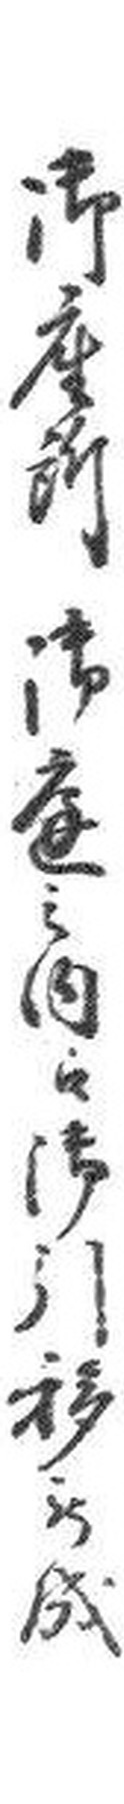御座所御庭之内江御引移被成
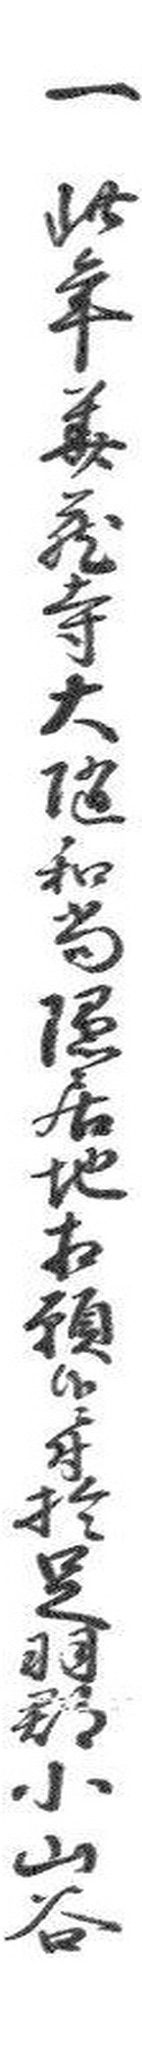一此年華蔵寺大随和尚隠居地相願候ニ付於足羽郡小山谷
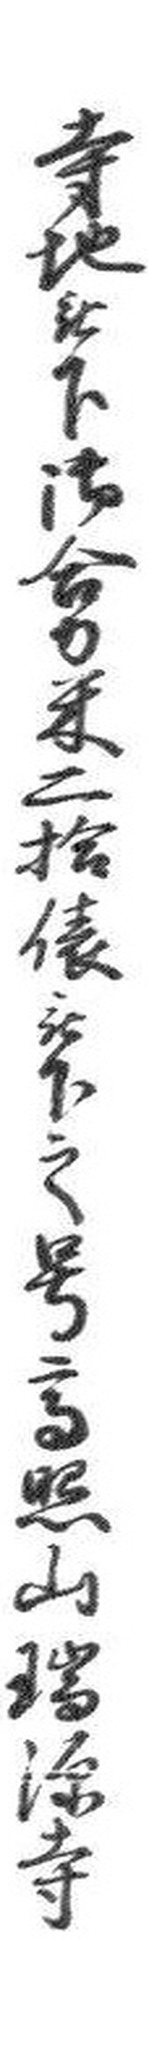寺地被下御合力米二拾俵被下之号高照山瑞源寺
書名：家譜 十一 昌親公 従延宝二年到延宝四年八月
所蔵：福井県文書館 Fukui Prefectural Archives
